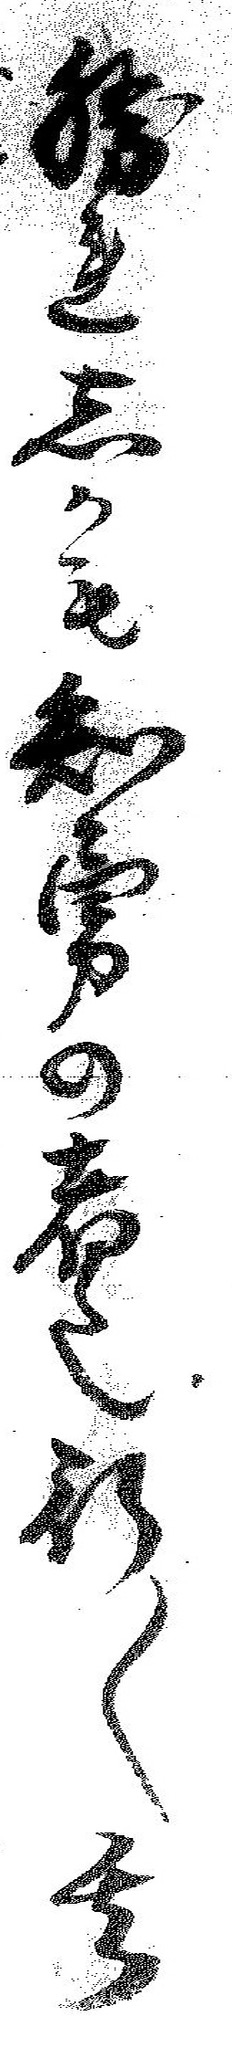勝れしかも知勇の者也行〳〵其
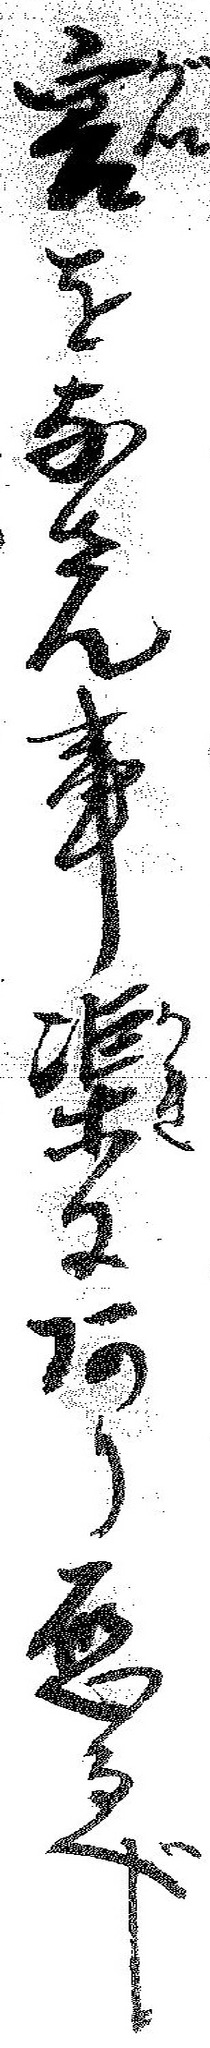害をなさん事渠にあり恐るべし
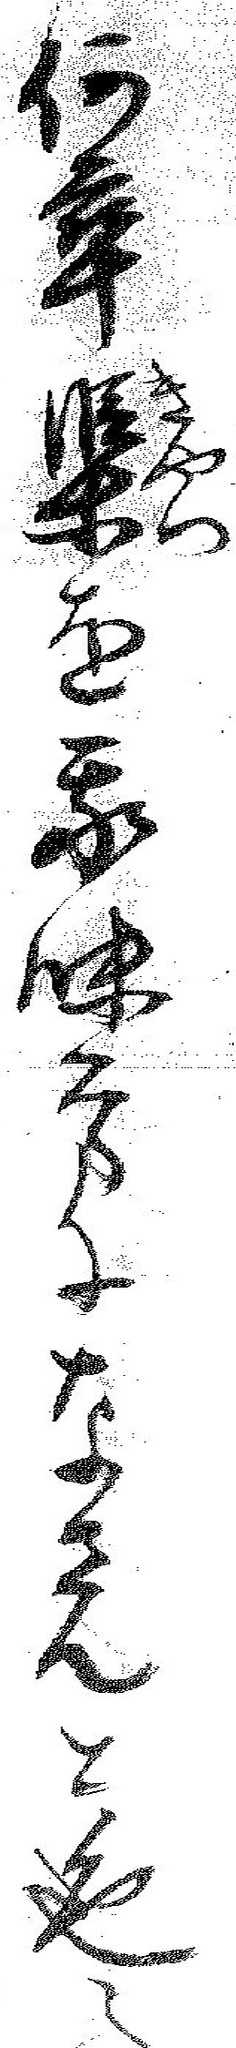何卒渠を我味方になさんと色々
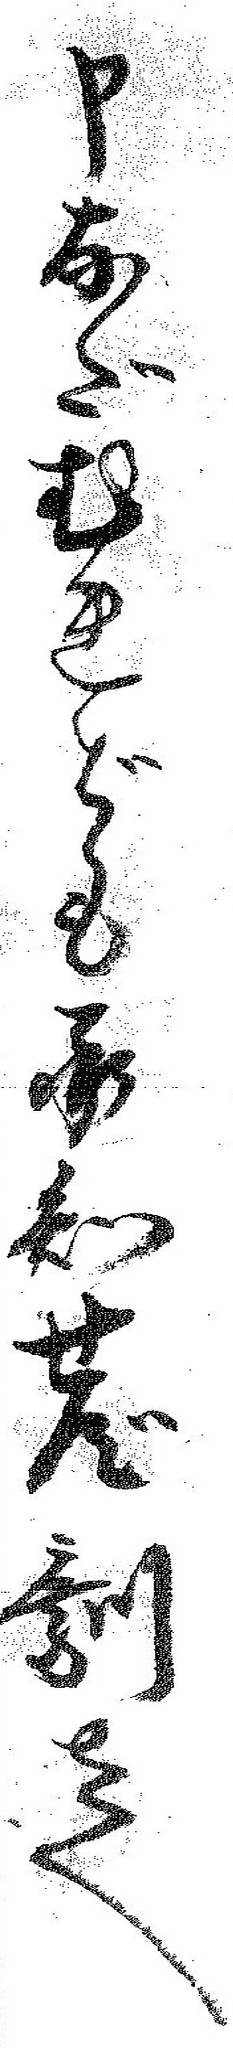申なだむれども承知せず剰さへ
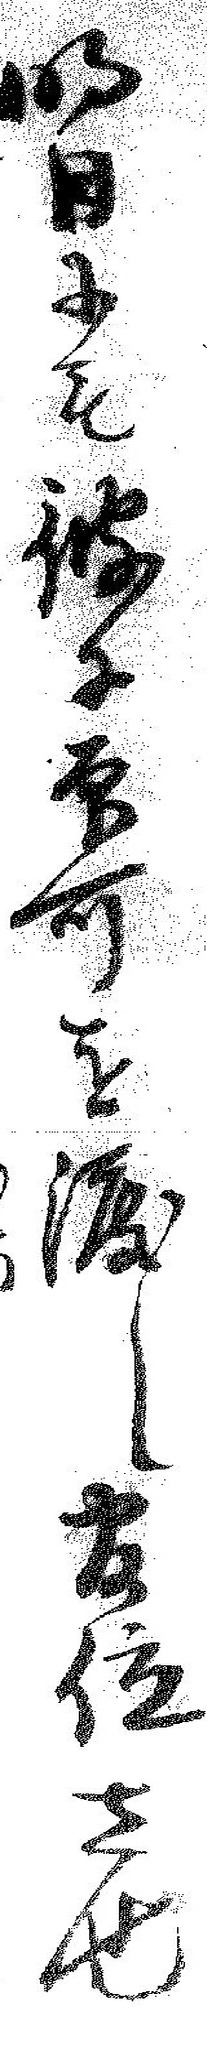明日にも彼に印可を渡し官位させ
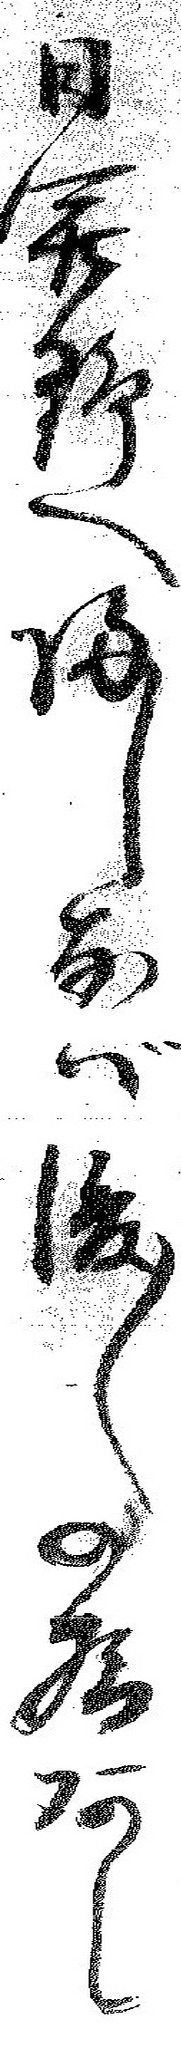日開野へ帰しなば後〳〵の為あし
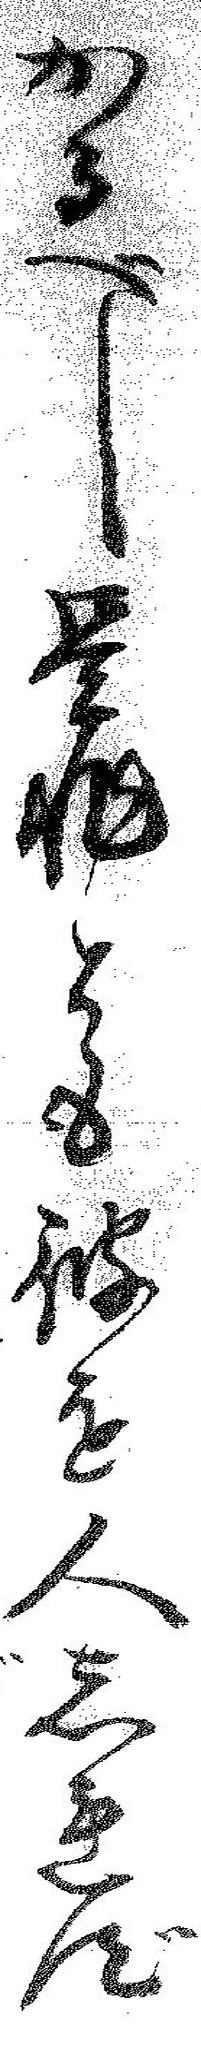かるべし是非とも彼を人しれず
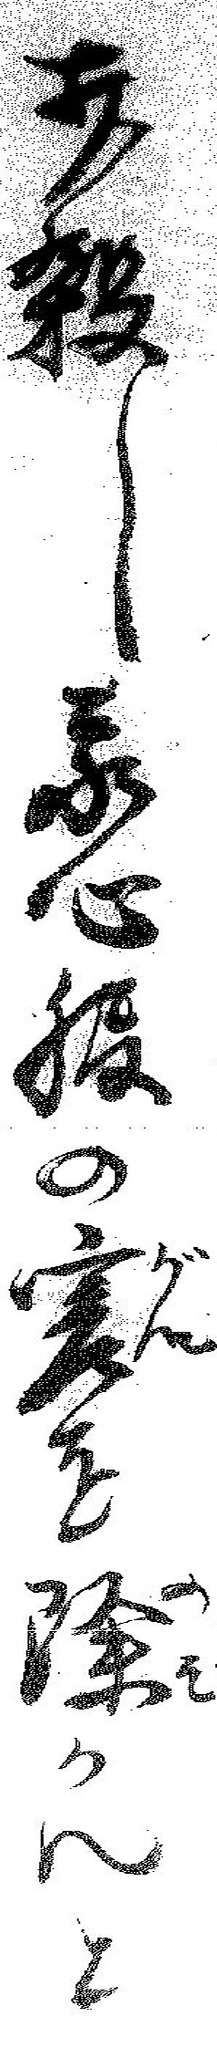打殺し我心腹の害を除かんと
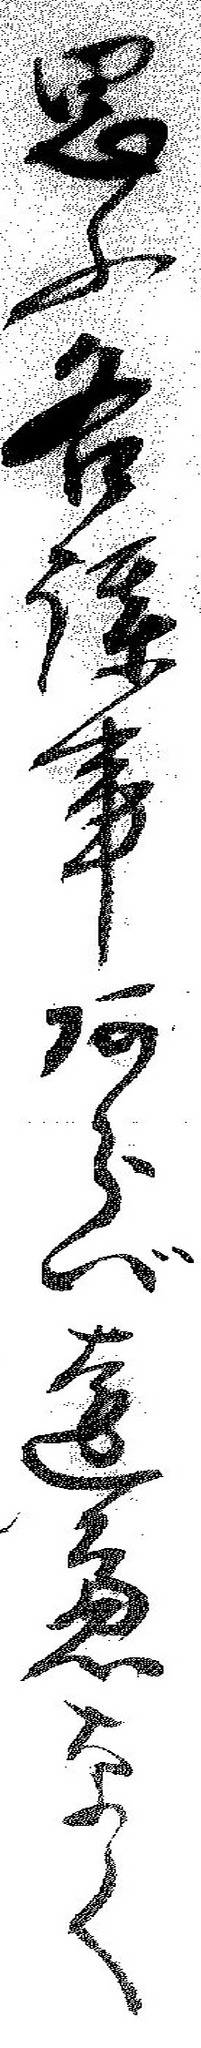思ふ各謀事あらば遠慮なく
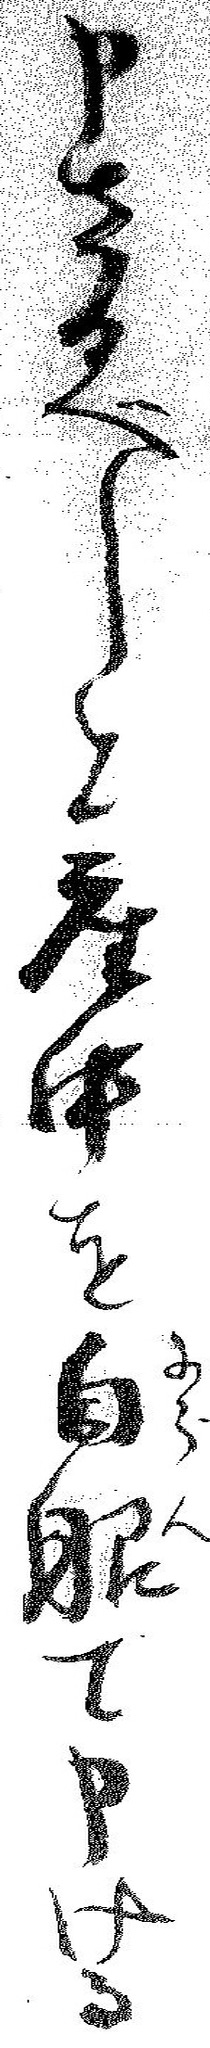申さるべしと座中を白眼て申ける
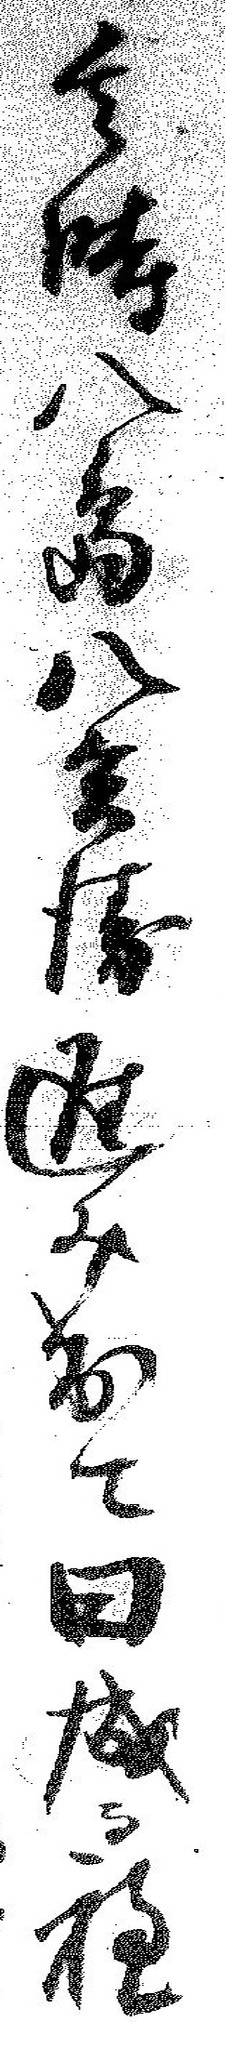其時八島八兵衛進み出て曰成る程
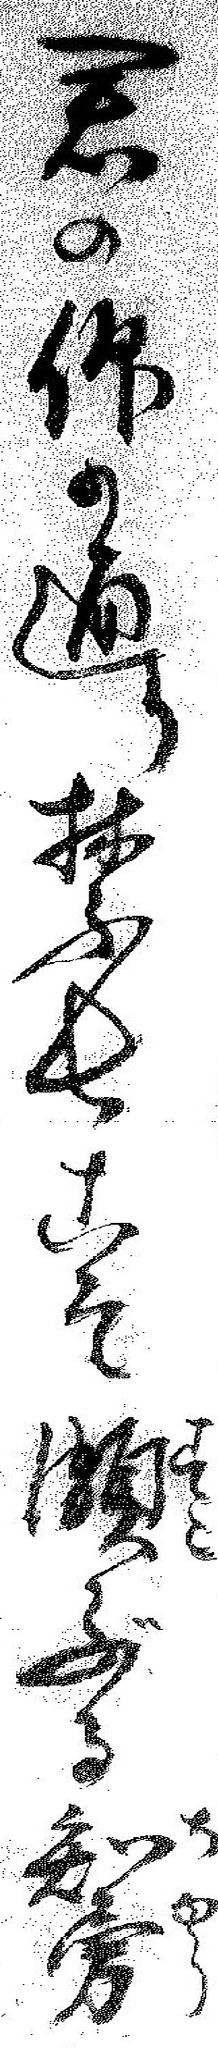君の仰の通り禁長こそ頗ぶる知勇
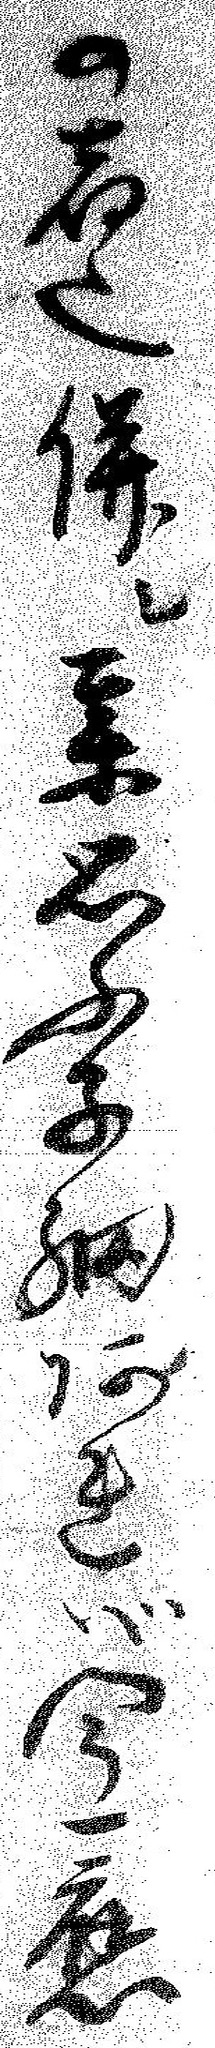の者也併し某思ふ子細あれば今一応

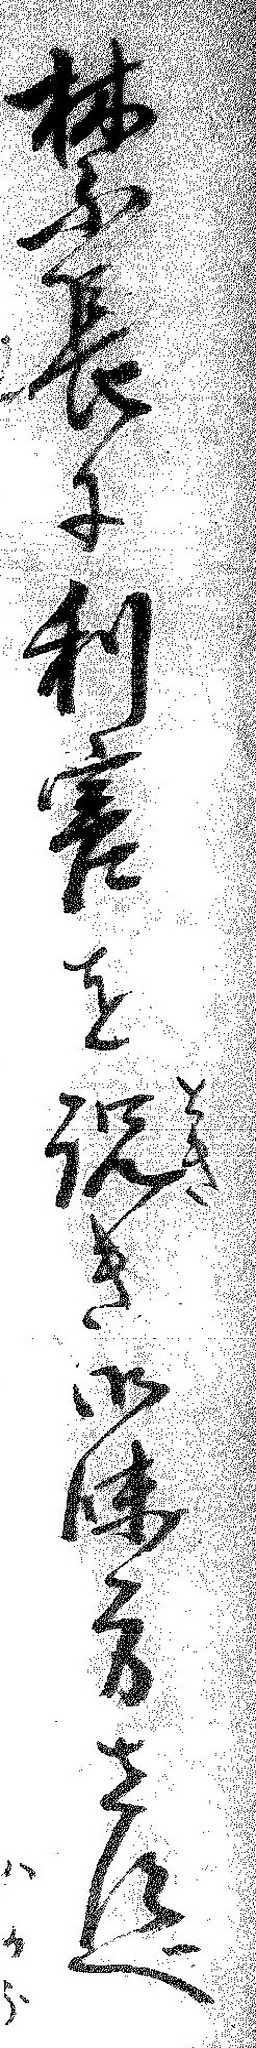禁長に利害を説き御味方さすべ
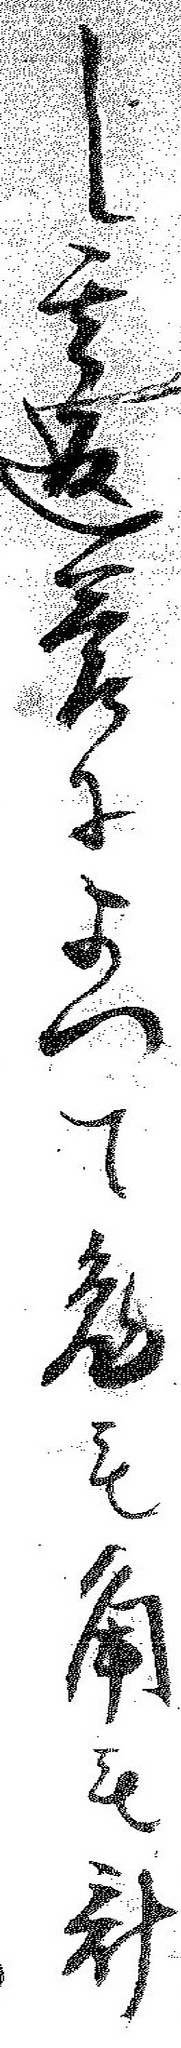し其返答によつて兎も角も計
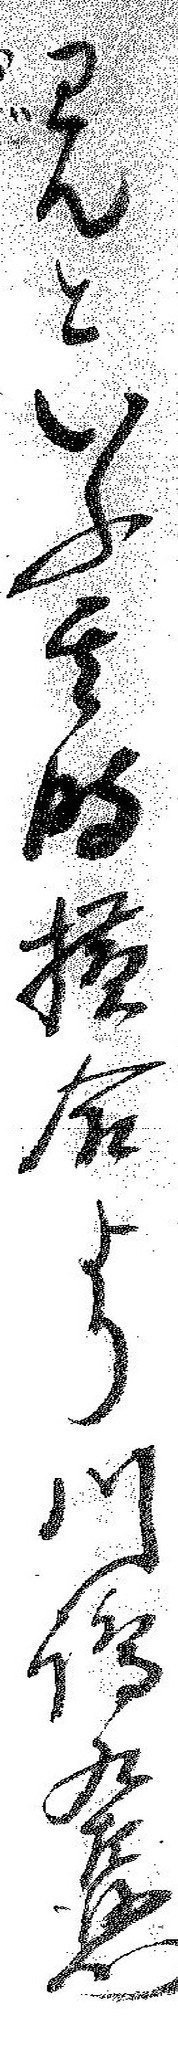わんといふ其時横合より川嶋九左衛門
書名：近頃古狸珍説　礼義智信
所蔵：徳島県立図書館
